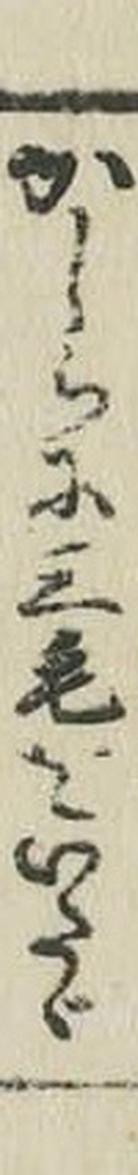かしらに三毛をいたゞ
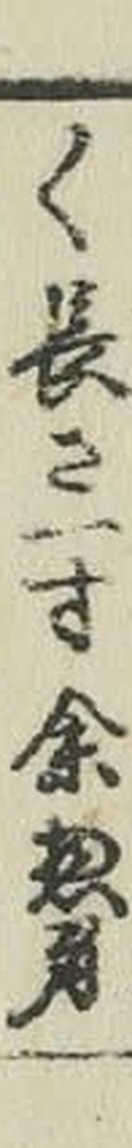く長さ一寸余惣身
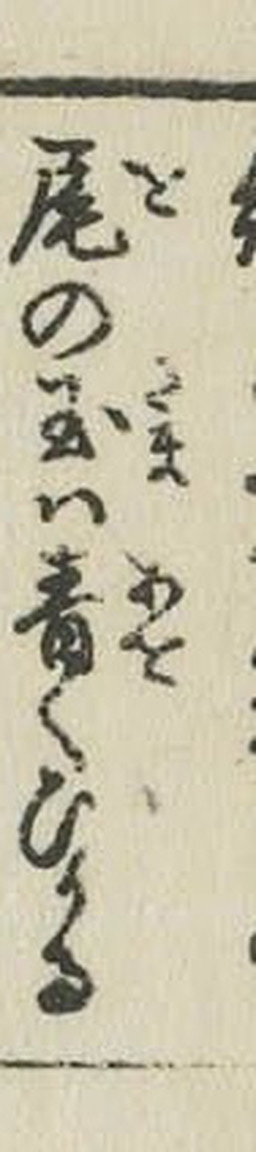尾の玉は青くひかる
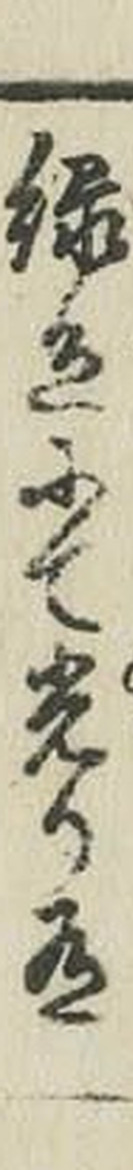緑色にて光り有
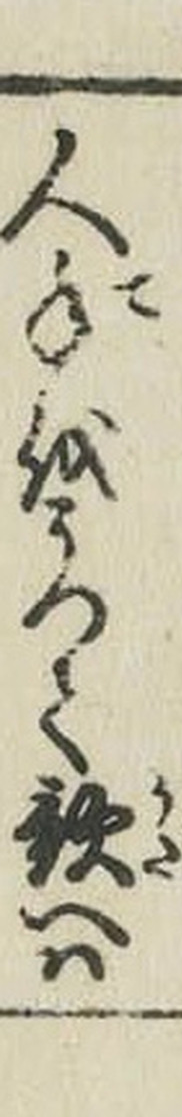人手をうつて歌へは
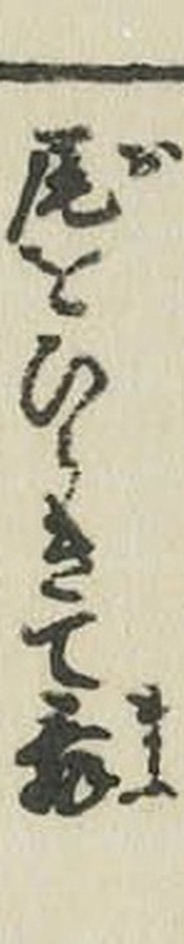尾をひらきて舞
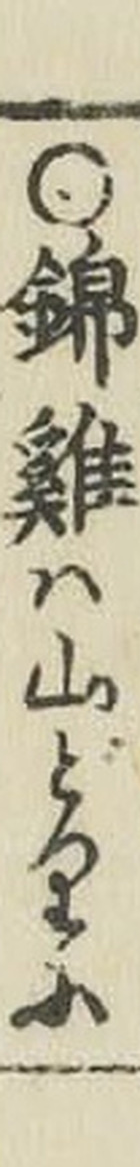○錦鶏は山どりに
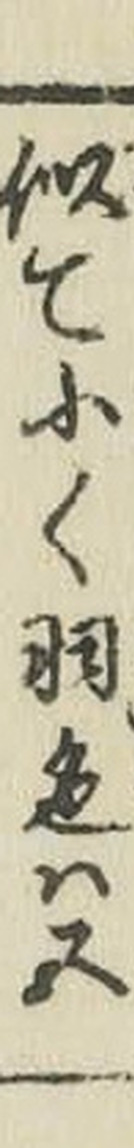似て小く羽色は五
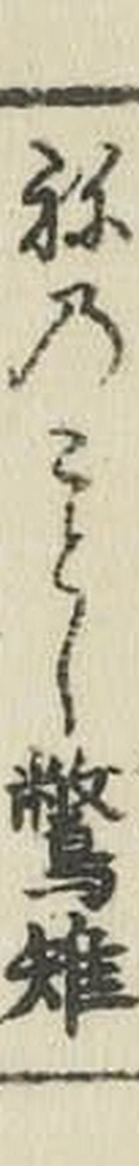ねのことし鷩雉
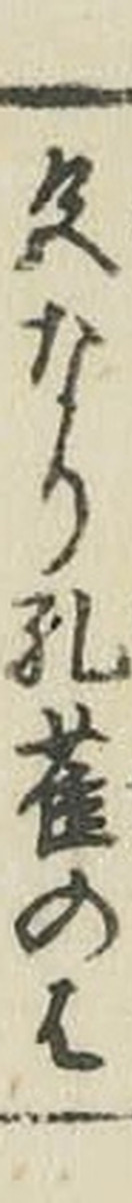色なり孔雀のは
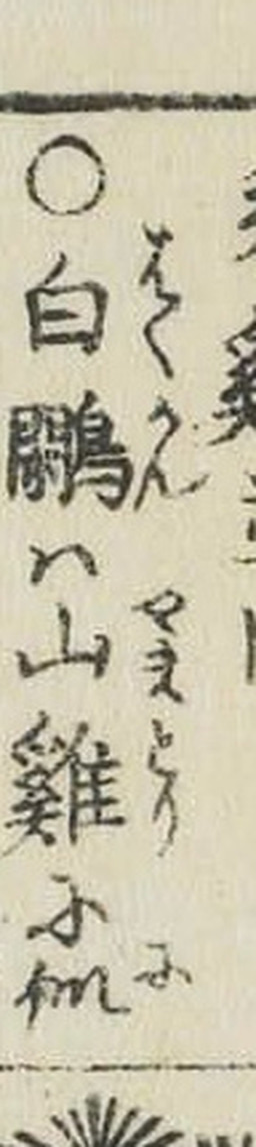○白鷴は山鶏に似
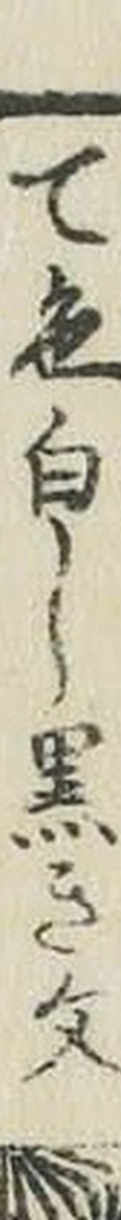て色白し黒き文
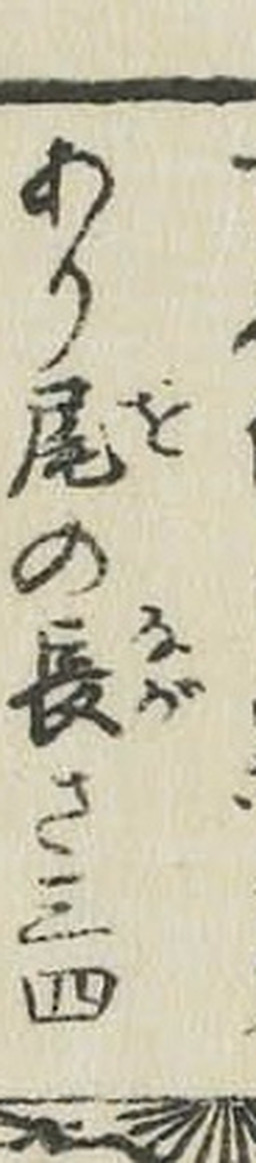あり尾の長さ三四
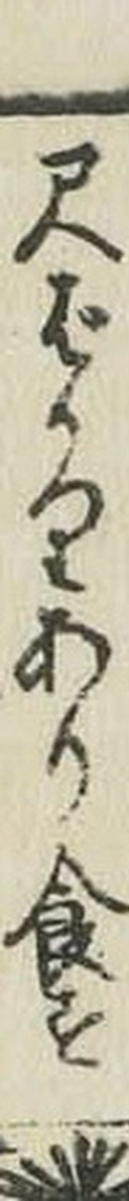尺ばかりあり食す
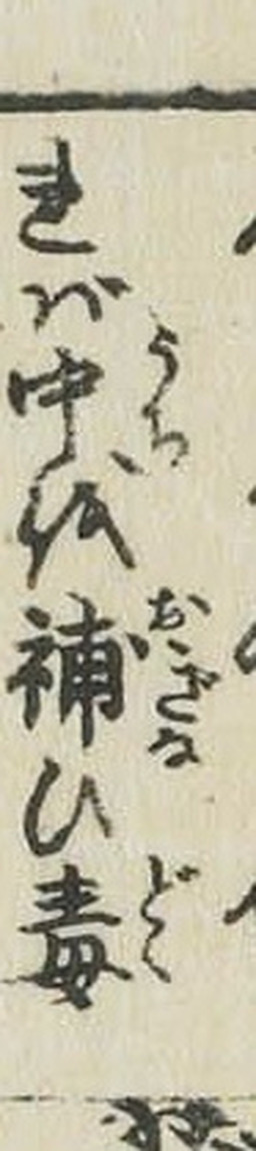れば中を補ひ毒を

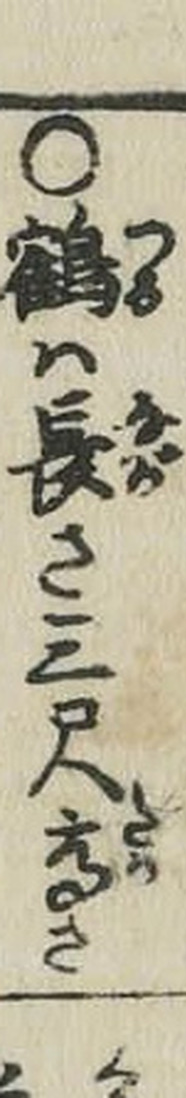○鶴は長さ三尺高さ
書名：増補頭書訓蒙図彙大成 10巻 6:巻之12-13
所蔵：東京学芸大学教育コンテンツアーカイブ
